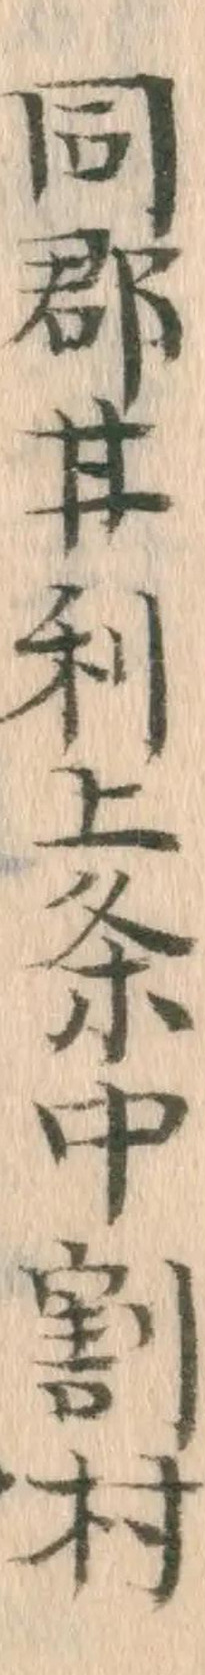同郡甘利上条中割村
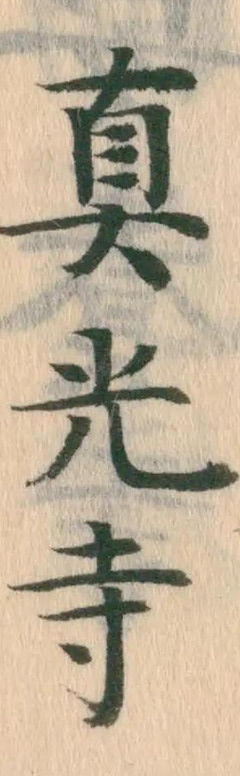真光寺
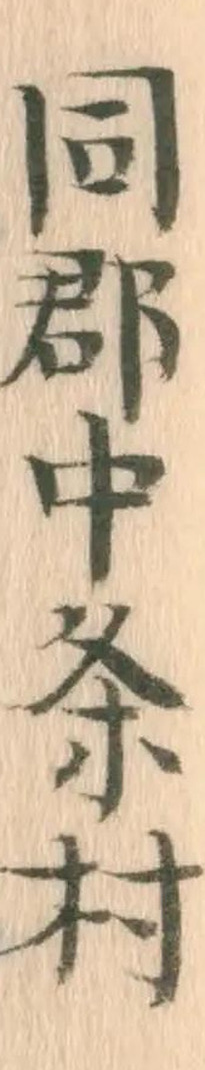同郡中条村
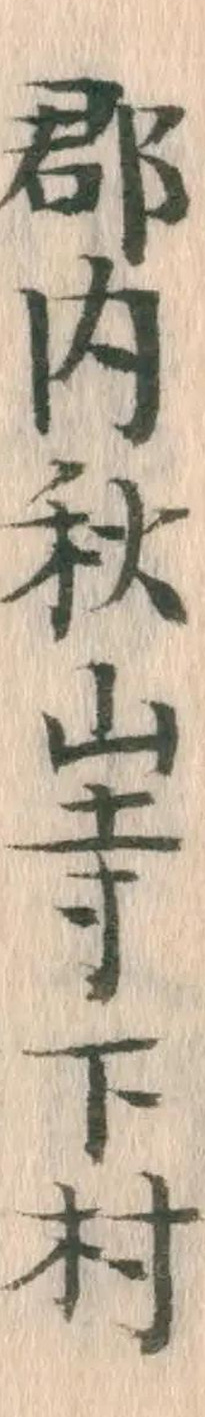郡内秋山寺下村
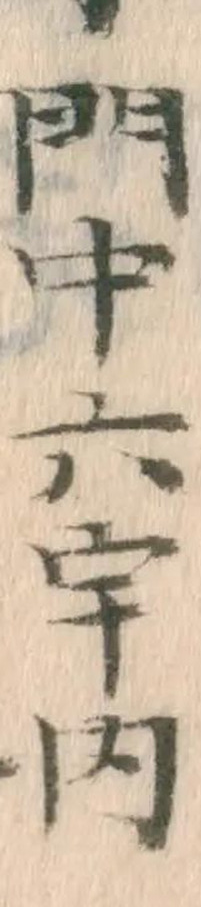門中六宇内
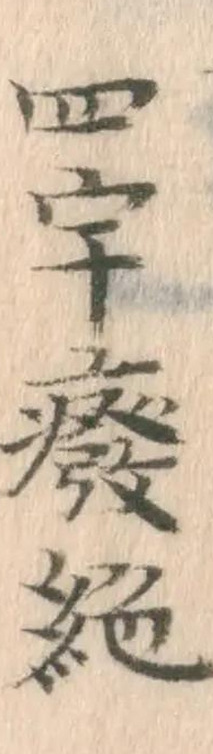四宇廃絶

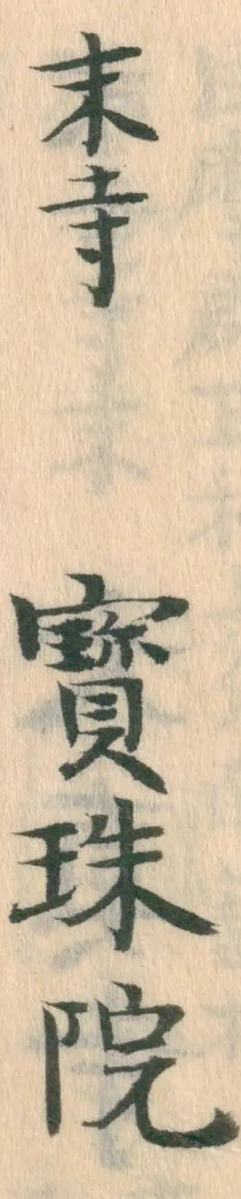未寺寶珠院
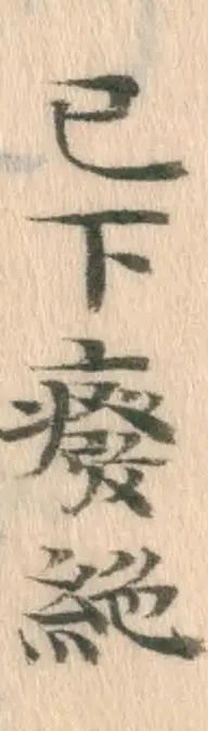已下廃絶
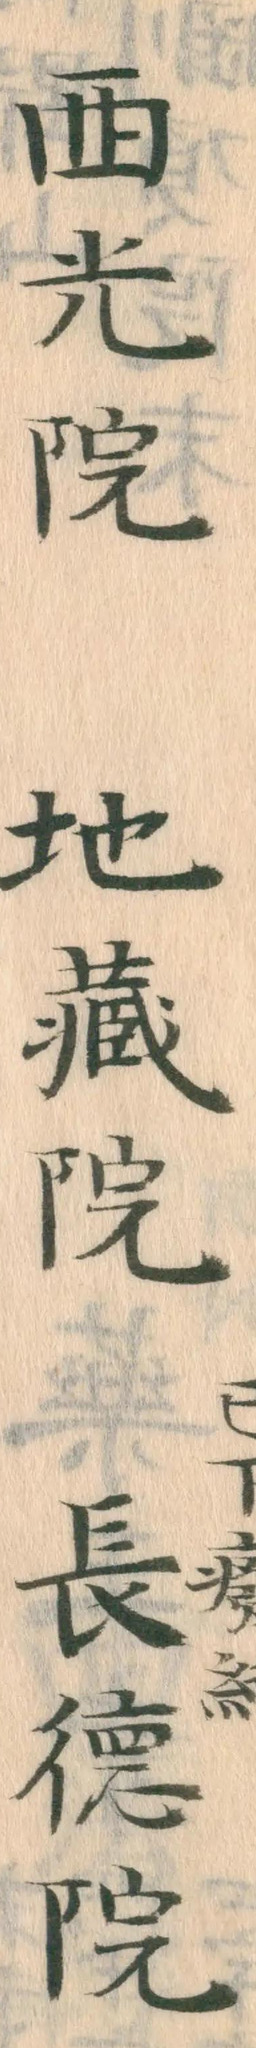西光院地蔵院長徳院
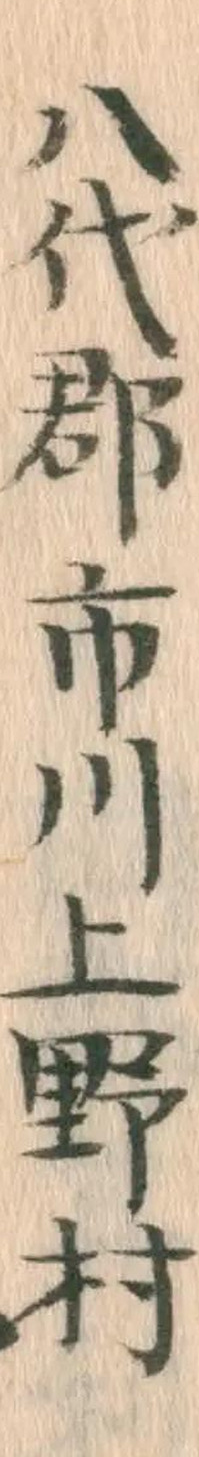八代郡市川大門村
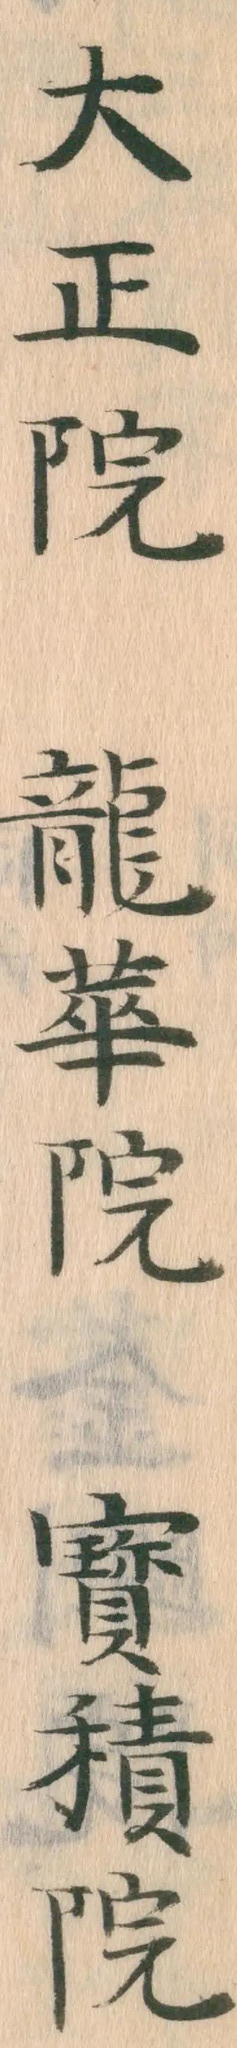大正院龍華院寶積院
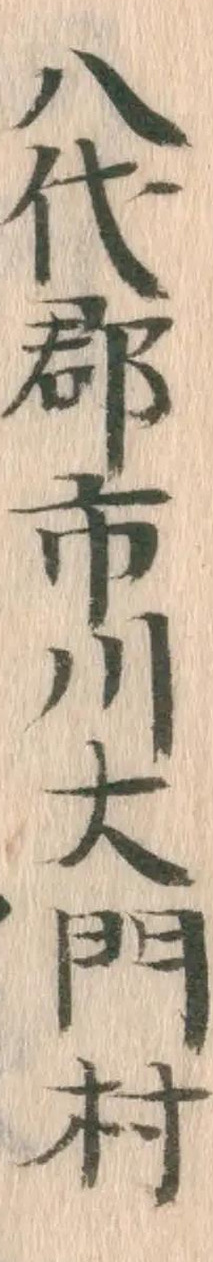八代郡市川大門村

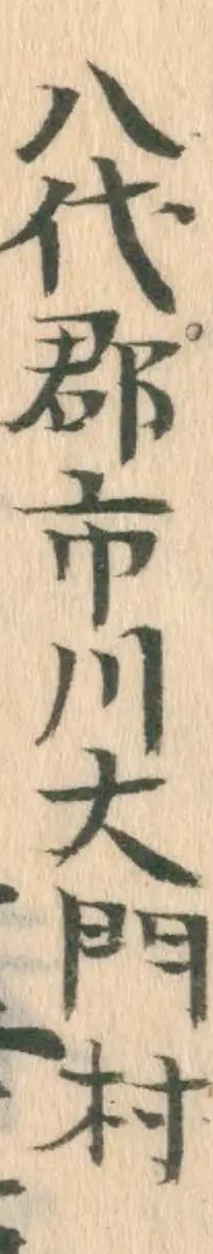八代郡市川大門村
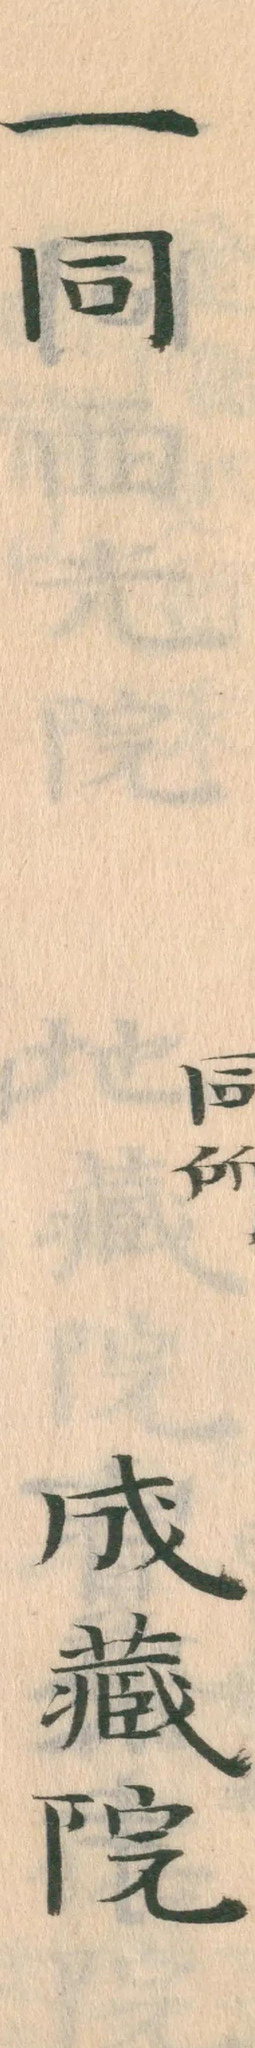一同成蔵院

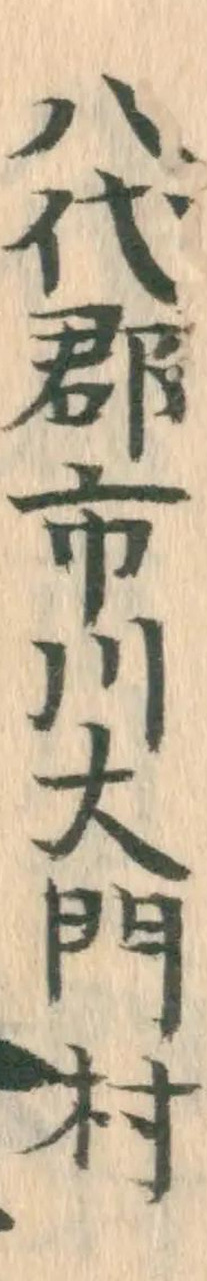八代郡市川大門村
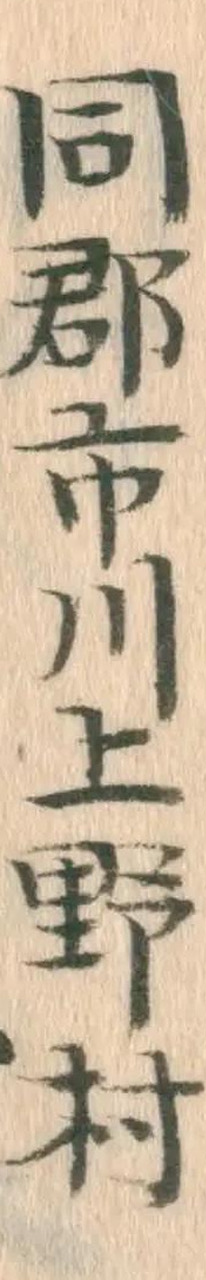同郡市川上野村
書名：古義真言宗本末帳 21巻. [4] 第三 伊賀国、伊勢国、志摩国、尾張国、三河国、遠江国、駿河国、伊豆国、甲斐国
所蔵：国立国会図書館 National Diet Library, JAPAN
